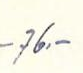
76
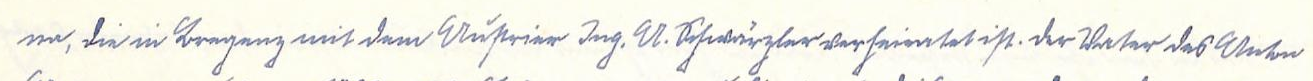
die in Bregenz mit dem Austrier Ing. A Schwärzler verheiratet ist. Der Vater des Anton
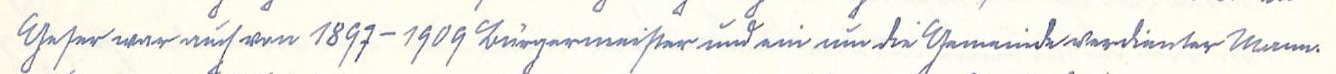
Geser war auch von 1897-1909 Bürgermeister und ein um die Gemeinde verdienter Mann.
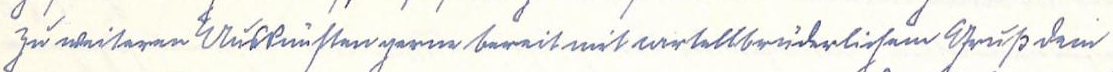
Zu weiteren Auskünften gerne bereit und mit cartellbrüderlichem Gruß dein
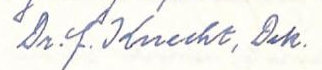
Dr. F. Knecht, Dekan
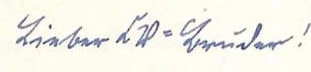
Lieber CV-Bruder!
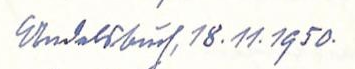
Andelsbuch, 18.11.1950.
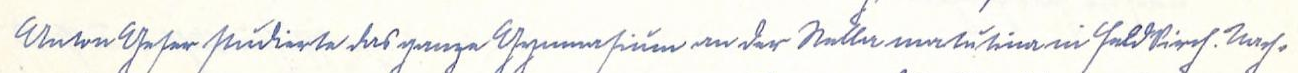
Anton Geser studierte das ganze Gymnasium an der Stella matutina in Feldkirch. Nach-
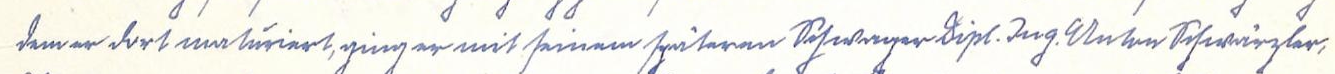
dem er dort maturiert, ging er mit seinem späteren Schwager Dipl. Ing. Anton Schwärzler,
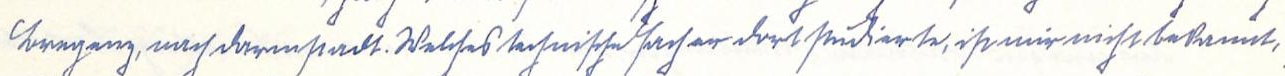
Bregenz, nach Darmstadt. Welches technische Fach er dort studierte, ist mir nicht bekannt,
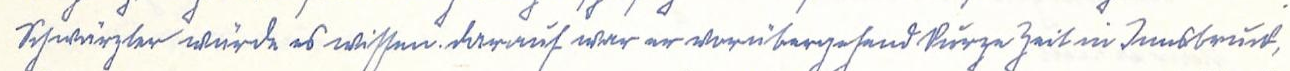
Schwärzler würde es wissen. Darauf war er vorübergehend kurze Zeit in Innsbruck,
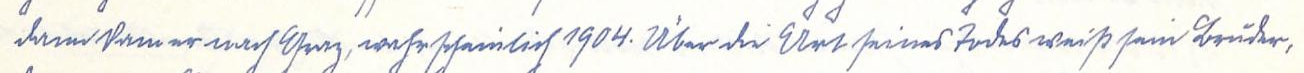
dann kam er nach Graz, wahrscheinlich 1904. Über die Art seines Todes weiß sein Bruder,
